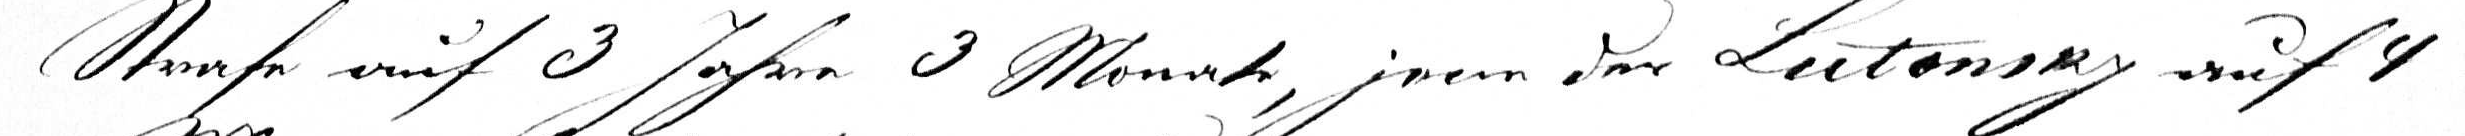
Strafe auf 3 Jahre 3 Monate, jenen der Lutonsky auf 4
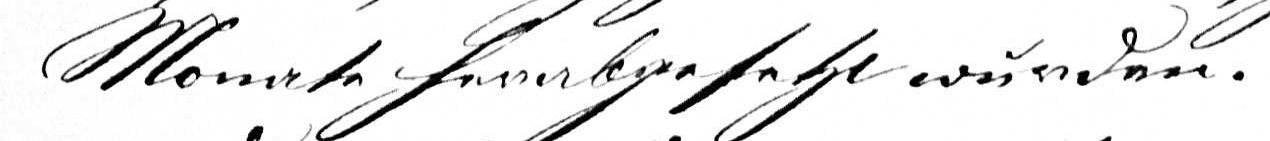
Monate herabgesetzt wurden.
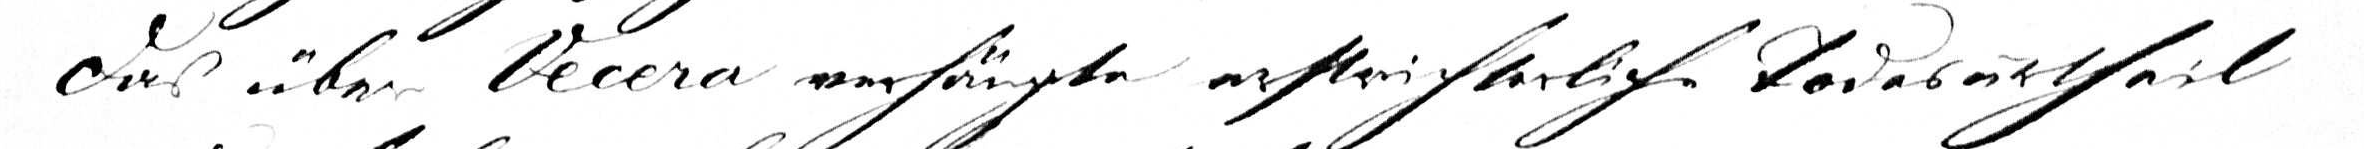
Das über Večera verhängte erstrichterliche Todesurtheil
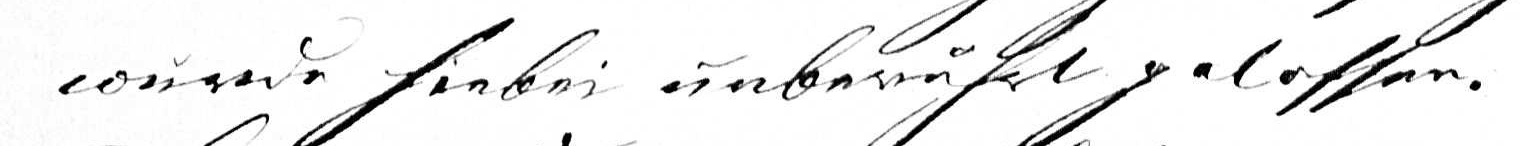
wurde hiebei unberührt gelassen.
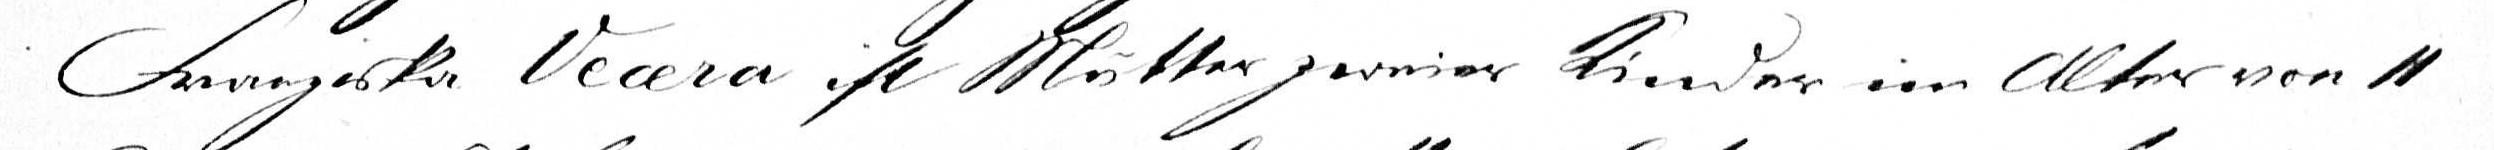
Franziska Večera ist Mutter zweier Kinder im Alter von 11
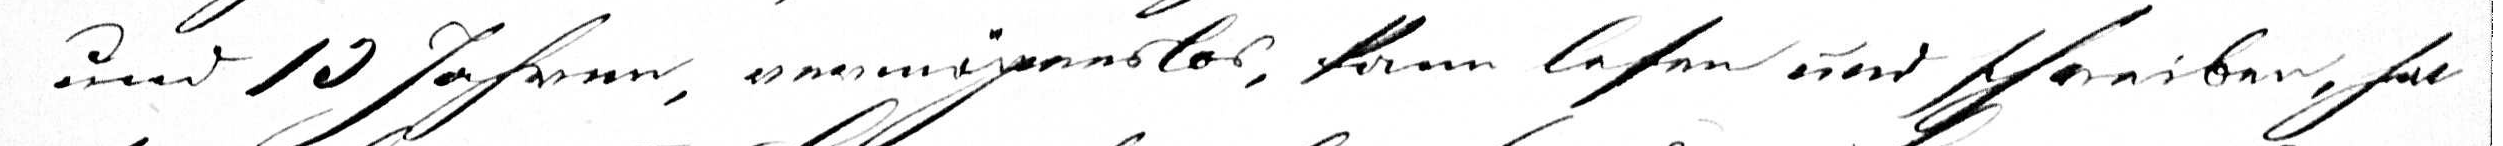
und 13 Jahren, vermögenslos, kann lesen und schreiben, hat
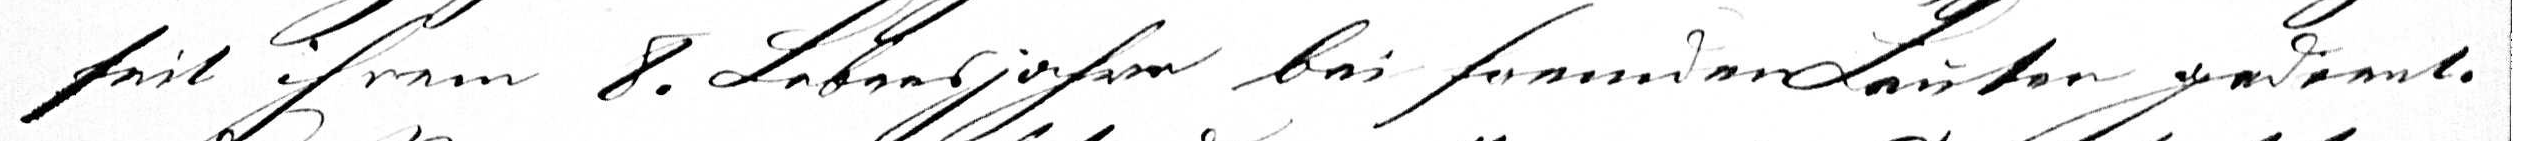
seit ihrem 8. Lebensjahre bei fremden Leuten gedient.
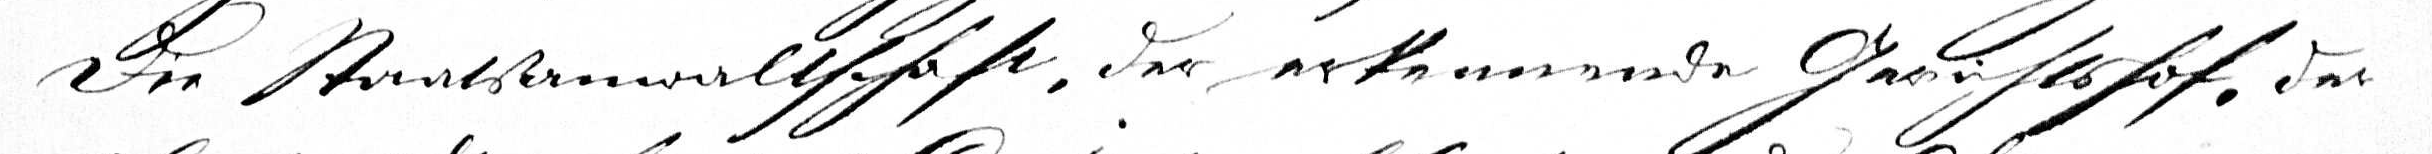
Die Staatsanwaltschaft, der erkennende Gerichtshof, der
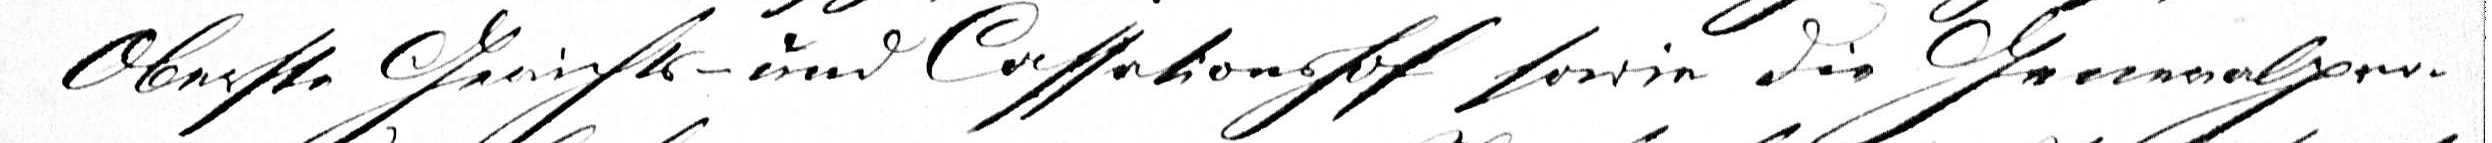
Oberste Gerichts- und Cassationshof sowie die Generalpro¬
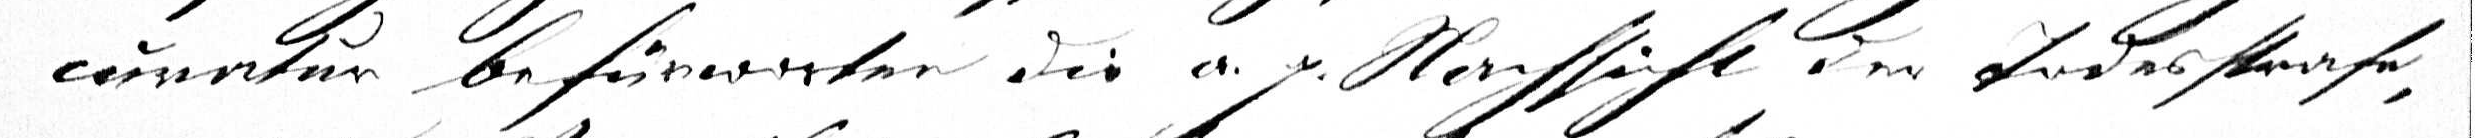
curatur befürworten die a.g. Nachsicht der Todesstrafe
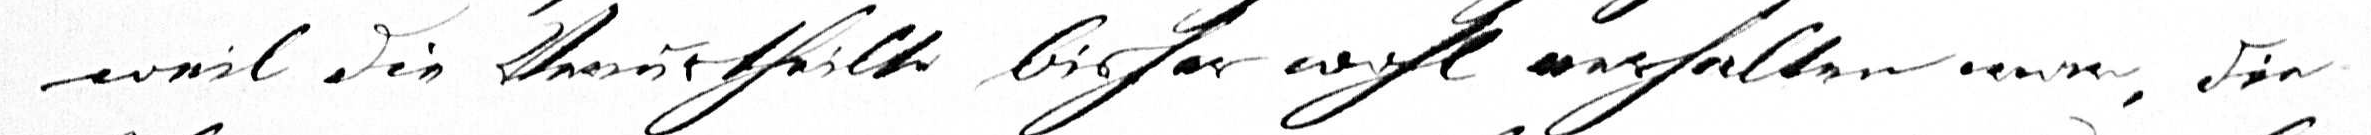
wie die Verurtheilte bisher wohl verhalten war, die
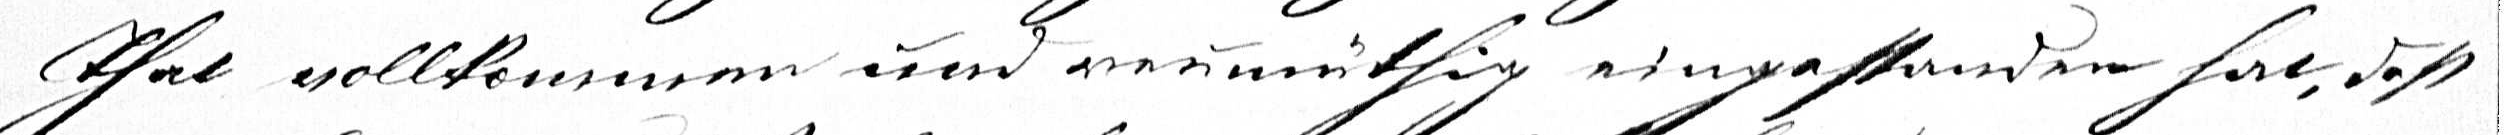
That vollkommen und reumüthig eingestanden hat, daß
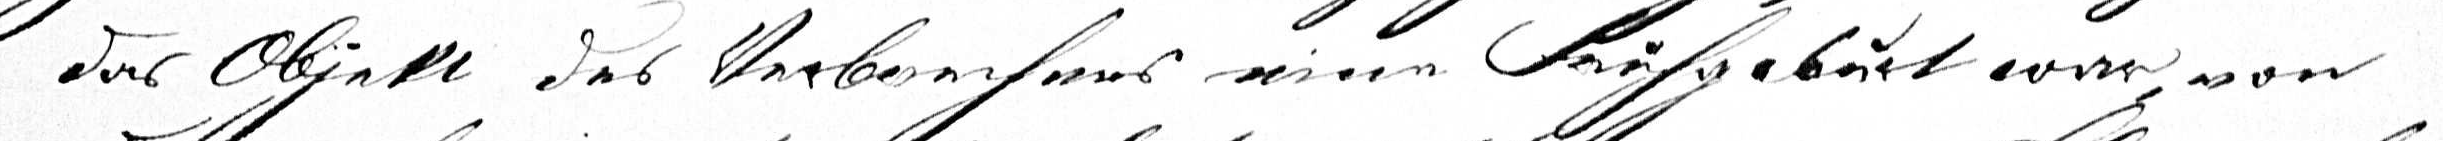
das Objekt des Verbrechens einen Frühgeburt war, von
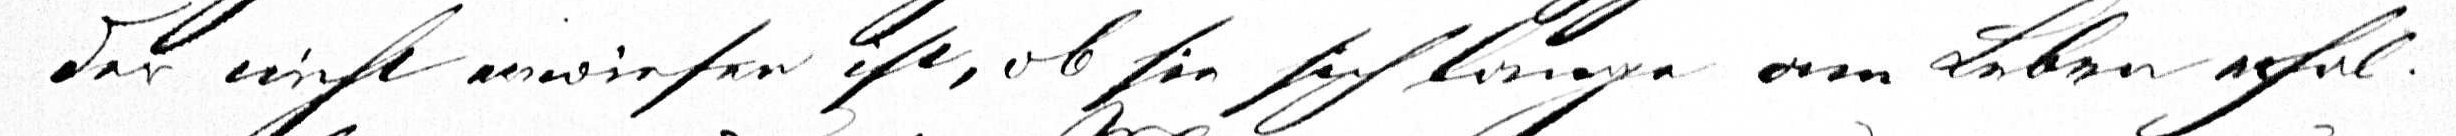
der nicht erwiesen ist, ob sie sich lange am Leben gehal¬
